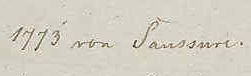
1773 von Saussure.
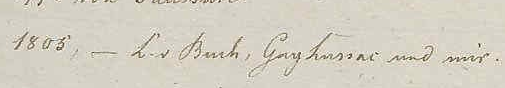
1803, – L. v Buch, Gay Lussac und mir.
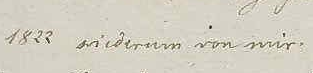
1822 wiederum von mir.
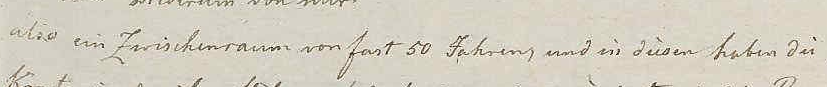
also ein Zwischenraum von fast 50 Jahren, und in diesen haben die
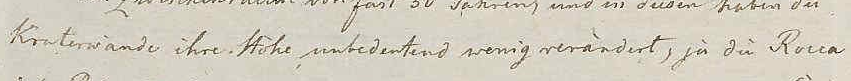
Kraterwände ihre Höhe unbedeutend wenig verändert, ja die Rocca
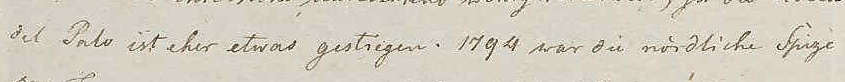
del Palo ist eher etwas gestiegen. 1794 war die nördliche Spize
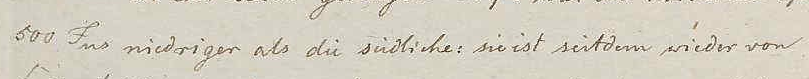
500 Fus niedriger als die südliche: sie ist seitdem wieder von
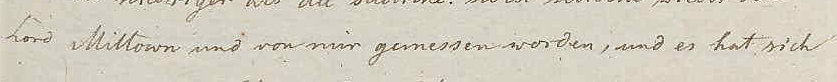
Lord Miltown und von mir gemessen worden, und es hat sich
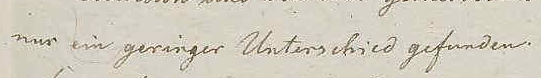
nur ein geringer Unterschied gefunden.
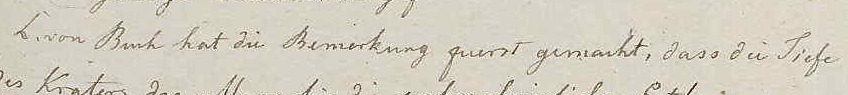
L. von Buch hat die Bemerkung zuerst gemacht, dass die Tiefe
